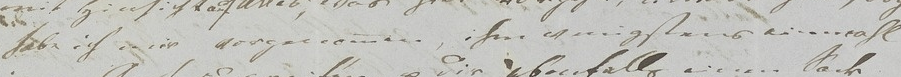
habe ich mir vorgenommen, ihm wenigstens einmahl
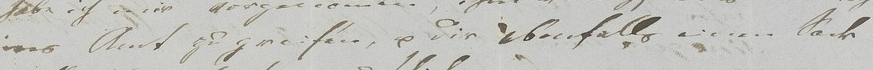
ins Amt zu greifen, & dir ebenfalls einen Sack
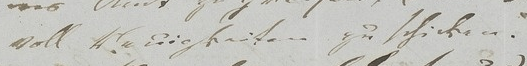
voll Neuigkeiten zu schicken.
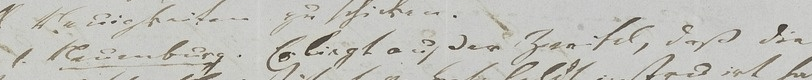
1. Neuenburg. Es liegt außer Zweifel, daß die
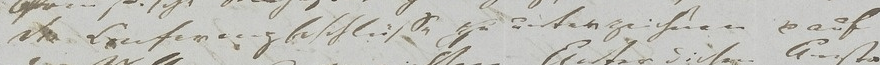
die Conferenzbeschlüße zu unterzeichnen & auf
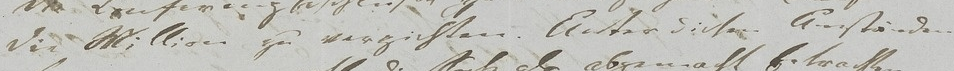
die Million zu verzichten. Unter diesen Umständen
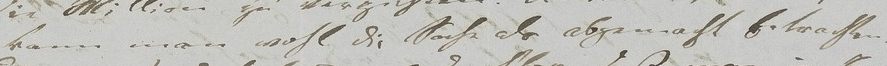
kann man wohl die Sache als abgemacht betrachten.
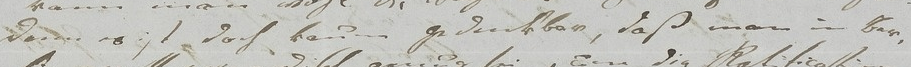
Denn es ist doch kaum gedenkbar, daß man in Ber-
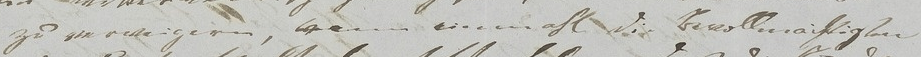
zu verweigern, wenn einmahl die Bevollmächtigten
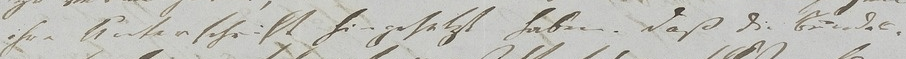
ihre Unterschrift hingesetzt haben. Daß die Bundes-
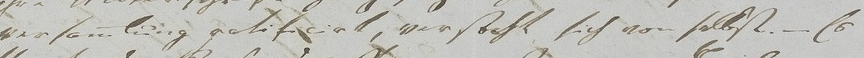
versammlung ratificirt, versteht sich von selbst. – Es
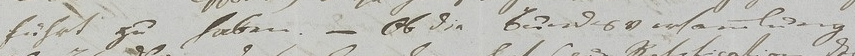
führt zu haben. – Ob die Bundesversammlung
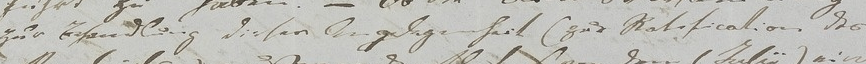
zur Behandlung dieser Angelegenheit (zur Ratification des
